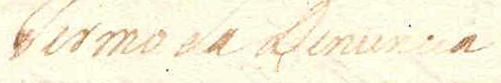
Termo da Denuncia
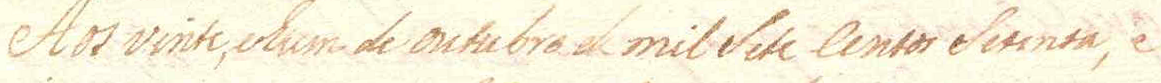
Aos vinte, e hum de outubro de mil SeteCentos e Setenta, e
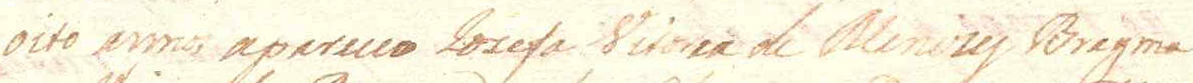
oito annos apareceo Iozefa Viuva de Menezes Bragmo
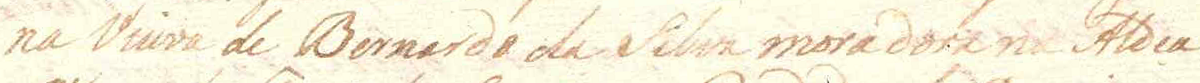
na Viuva de Bernardo da Silva moradora na Aldea
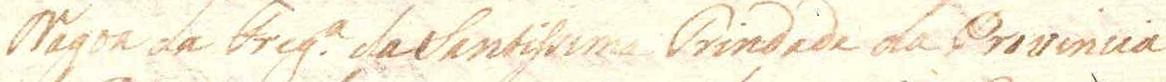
Nagoa da Freg.a da Santissima Trindade da Provincia
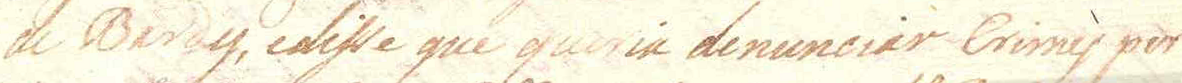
de Bardes, e disse que queria denunciar Crimes per
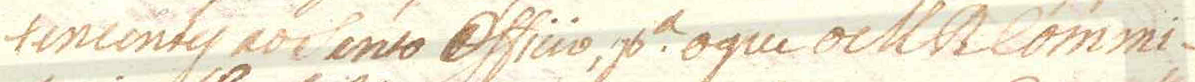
tencentes ao Santo Officio, p.a o que o M R Commi
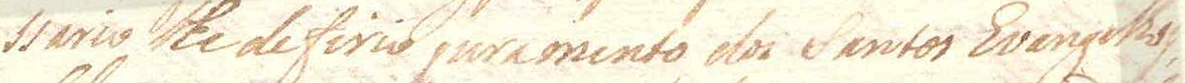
ssario lhe defirio juramento dos Santos Evangelhos,
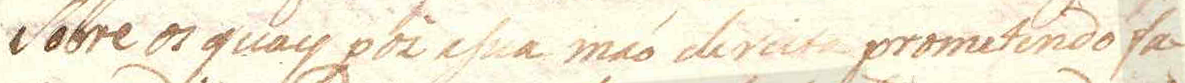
Sobre os quaes poz a sua maõ direita prometendo fa
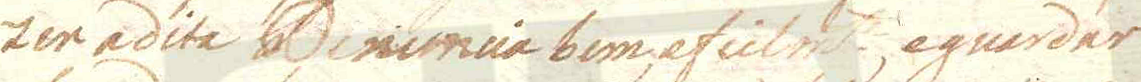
zer a dita Denuncia bem, e fielmt.e, e guardar
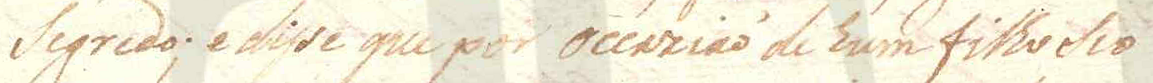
Segredo; e disse que por occaziaõ de hum filho Seo
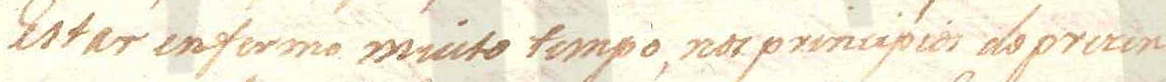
estar infermo muito tempo, nos principios do prezen
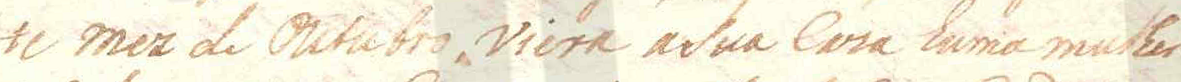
te mez de Outubro, viera a Sua Caza huma mulher
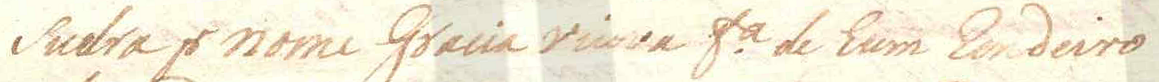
sudra pr nome Gracia viuva f.a de hum Rendeiro
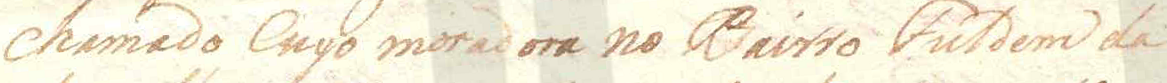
chamado Ciryo moradora no Bairro Fuldem da
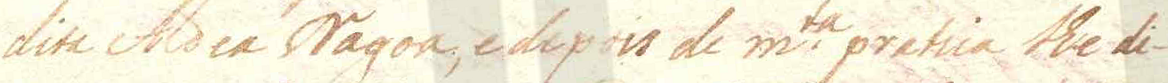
dita Aldea Nagoa, e depois de m.ta pratica lhe di
